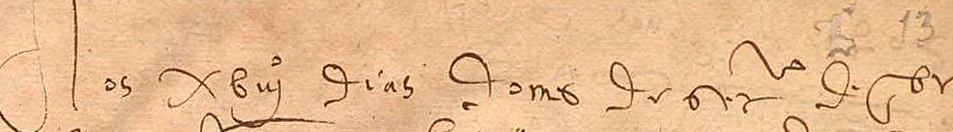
Aos xbiijo dias do mes de setro de j̄ bc
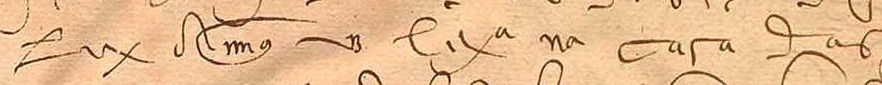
Lix Ann̄ꝯ em lixa na casa das
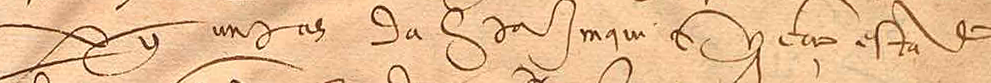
ꝑguntas da Sta Jmquisyção estādo
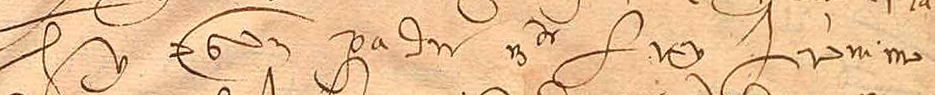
hy o s̄or padre mte frey Jeronimo
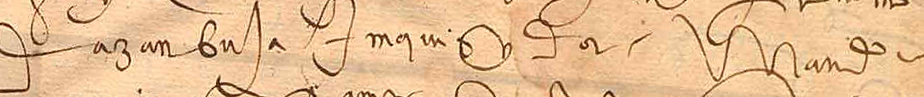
dazanbuJa Jmquisydor Mandou
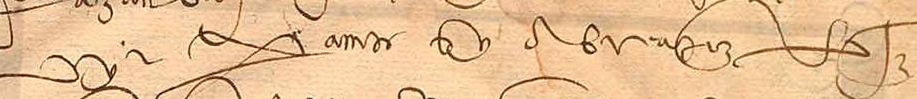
vyr ꝑante sy A breatiz Rōjz
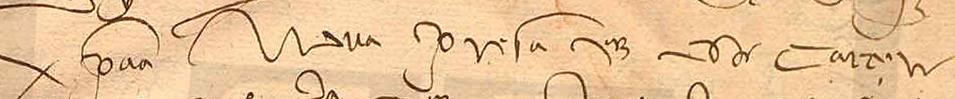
Xp̄aa Noua presa em este carcere
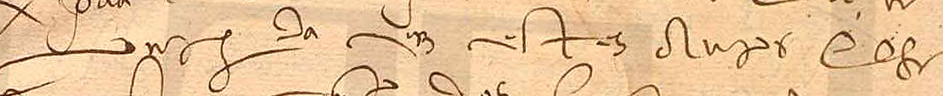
Conthda em estes Autos e lhe
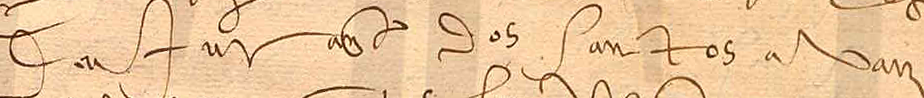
deu Juramto dos Sanctos avam
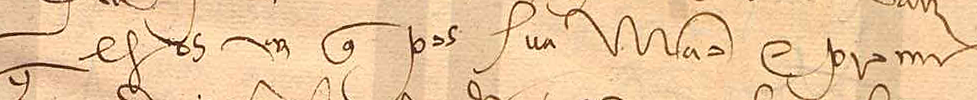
gelhos em q̄ pos sua Mão e prome
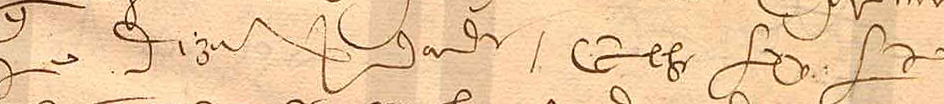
teo dize ꝟdade / E lhe foy fto
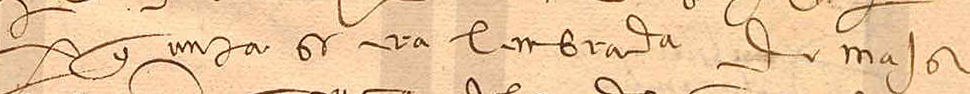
ꝑgunta se era lembrada de maJs
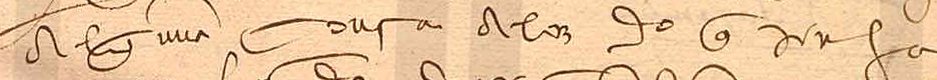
Alguūa Cousa Alem do q̄ tinha
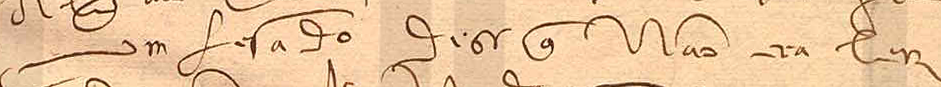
Comfesado dise q̄ Não era lem
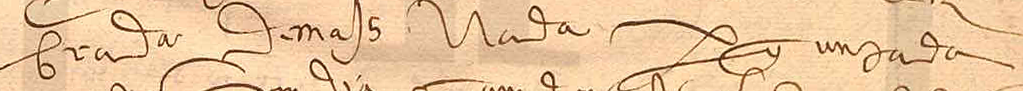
brada de maJs Nada ꝑguntada
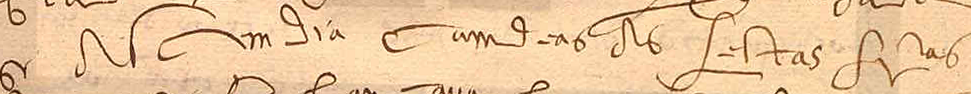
se Ascemdia Camdeas As sestas frras
